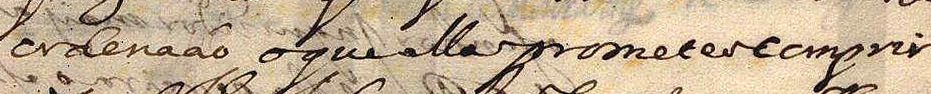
ordenado o que ella prometeo comprir
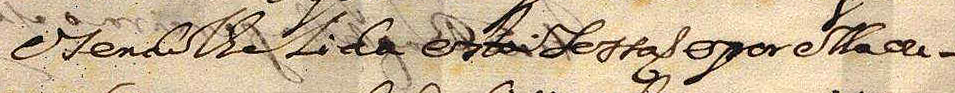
e sendolhe lida esta Sessaõ e por ella ou
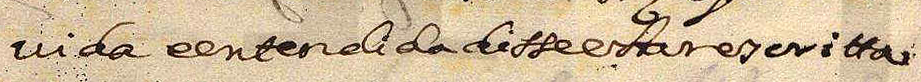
uida e entendida disse estar escritta
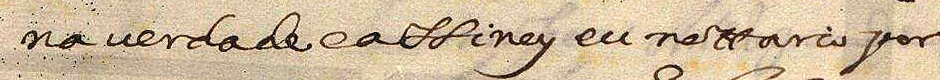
na uerdade e assiney eu nottario por
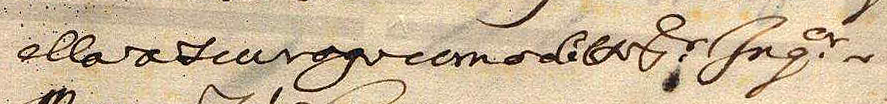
ella a seu rogo com o ditto s.or Jnq.or.
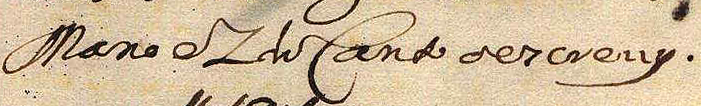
ManoeL do Canto o escreuy.
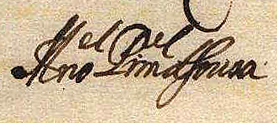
Mnoel Pimel d̄ Sousa
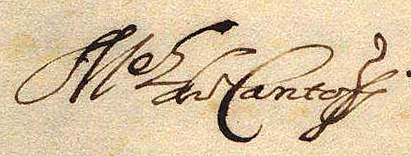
MeL do Canto
